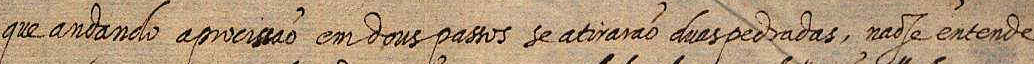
que andando a procissaõ em dous passos se atiraraõ duas pedradas, naõ se entende
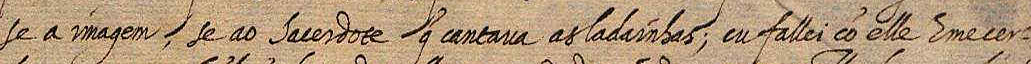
se a imagem, se ao Sacerdote q̄ cantaua as ladainhas; eu fallei cō elle E me cer
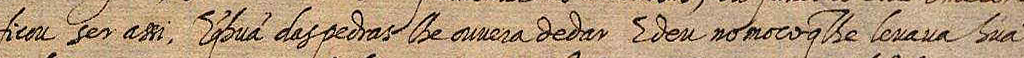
ficou ser assi. E huā das pedras lhe ouuera de dar E deu no moco q̄ lhe leuaua huā
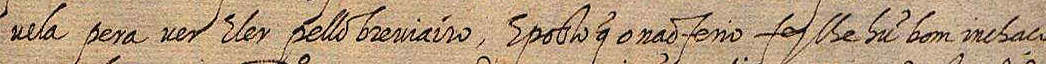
uela pera uer E ler pello breuiairo, E posto q̄ o naõ ferio fezlhe hū bom inchaço
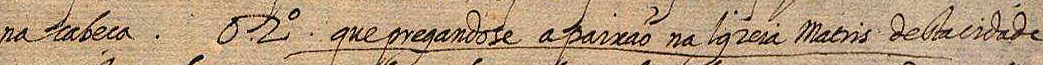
na cabeça. O 2o. que pregandose a paixaõ na Igreia Matris desta cidade
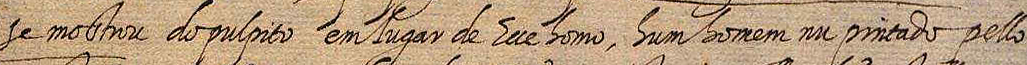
se mostrou do pulpito em lugar de Ecce homo, hum homem nu pintado pello
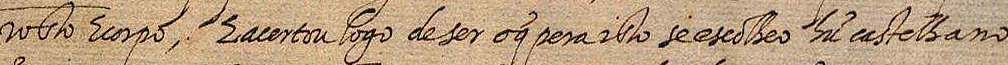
rosto E corpo, E acertou logo de ser o q̄ pera isto se escolheo hū castelhano
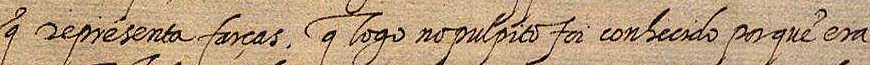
q̄ representa farças q̄ logo no pulpito foi conhecido por quē era.
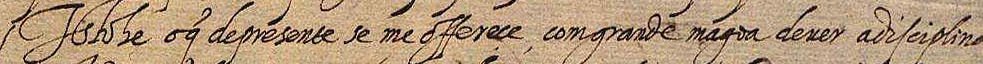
Isto he o q̄ de presente se me offereçe, com grande magoa de uer a disciplina
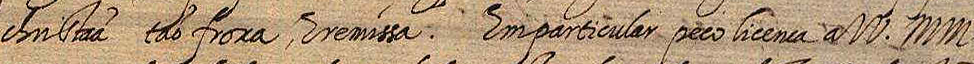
christaā taõ froxa E remissa. Em particular peco licenca a VV. MM.
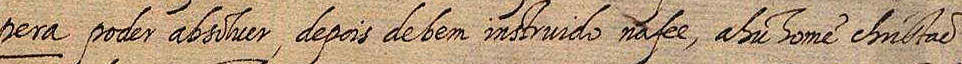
pera poder absoluer, depois de bem instruido na fee, a hū homē christaõ
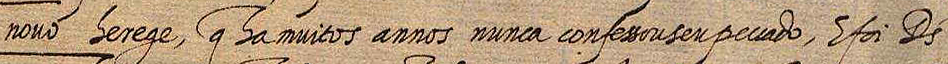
nouo herege, q̄ ha muitos annos nunca confessou seu peccado, E foi Ds̄
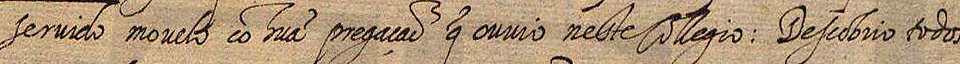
seruido mouelo cō huā pregaçaõ q̄ ouuio neste Collegio: Descobrio todos
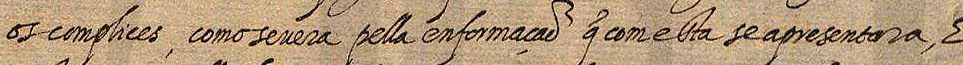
os complices, como se uera pella enformaçaõ q̄ com esta se apresentara, E
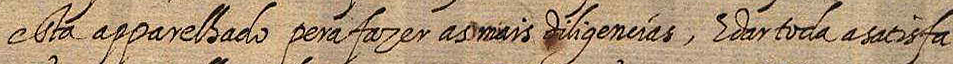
esta apparelhado pera fazer as mais diligencias, E dar toda a satisfa
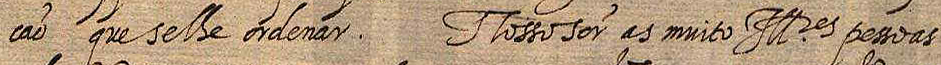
caõ que se lhe ordenar. Nosso sor̄ as muito Ill̄.res pessoas
